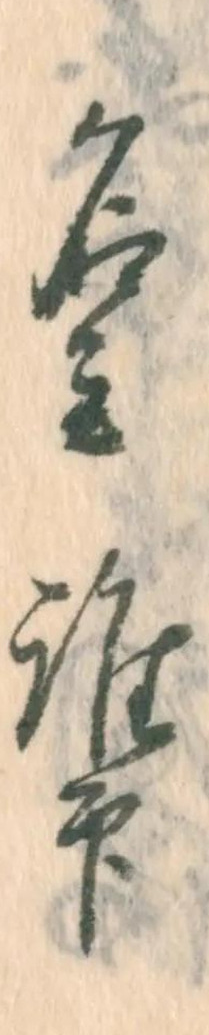名主誰印
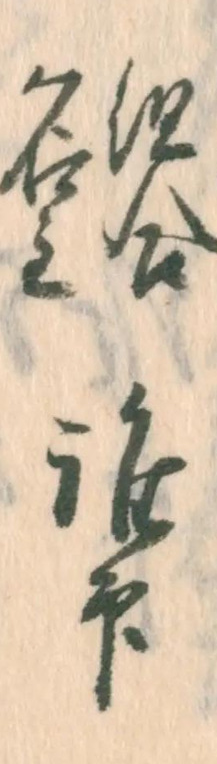名主誰印
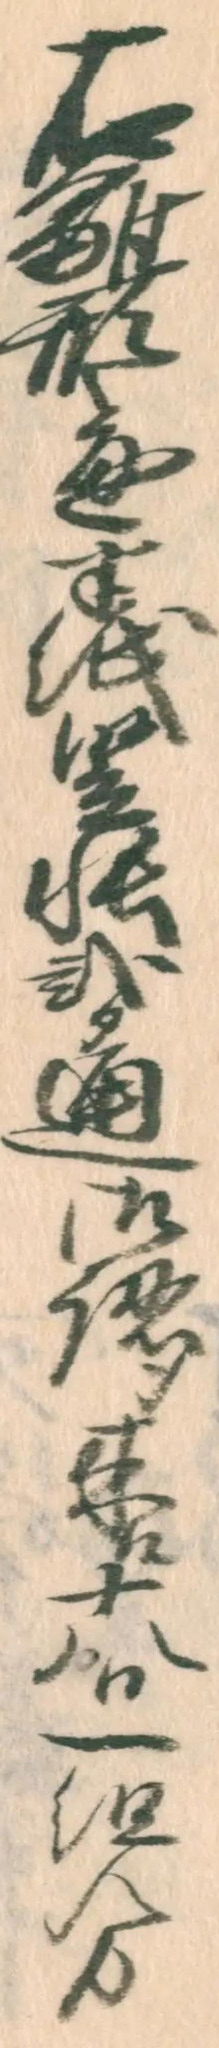右雛形之通半紙竪帳弐タ通御認メ来ル十八日一組分
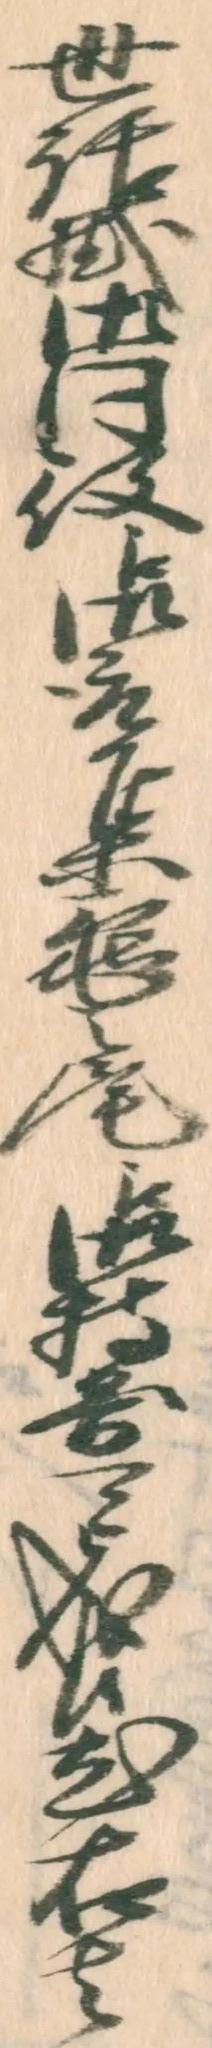世話掛御同役江御取集亀之尾江御持寄可被成候尤右は
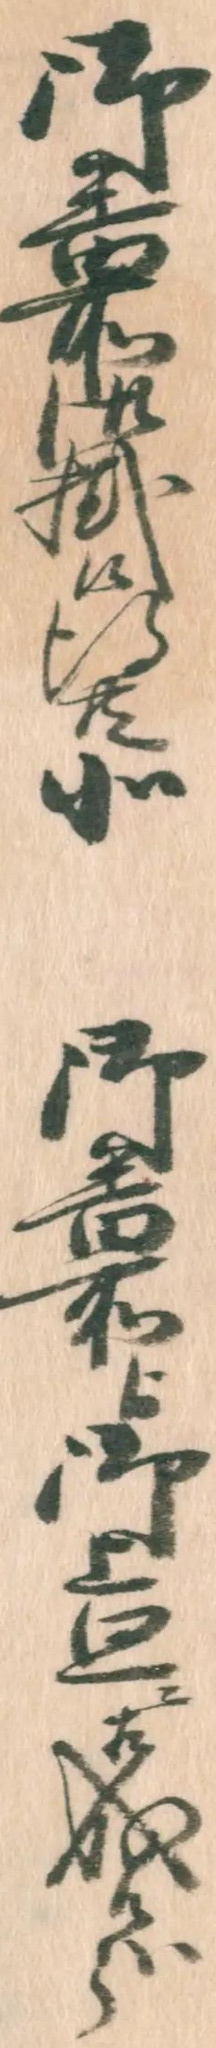御番所御掛候得共北御番所ゟ御上廻ニ相成候分
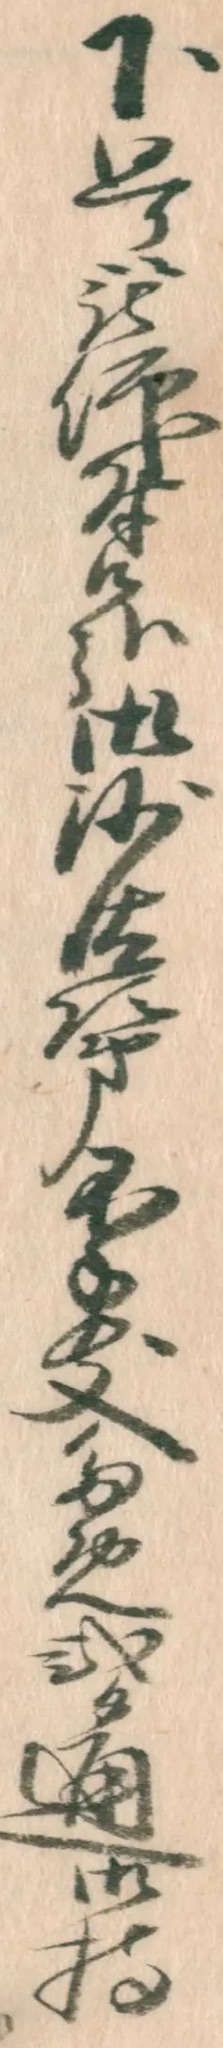下廻りニ被仰付候哉御沙汰次第不手支ため弐タ通御持
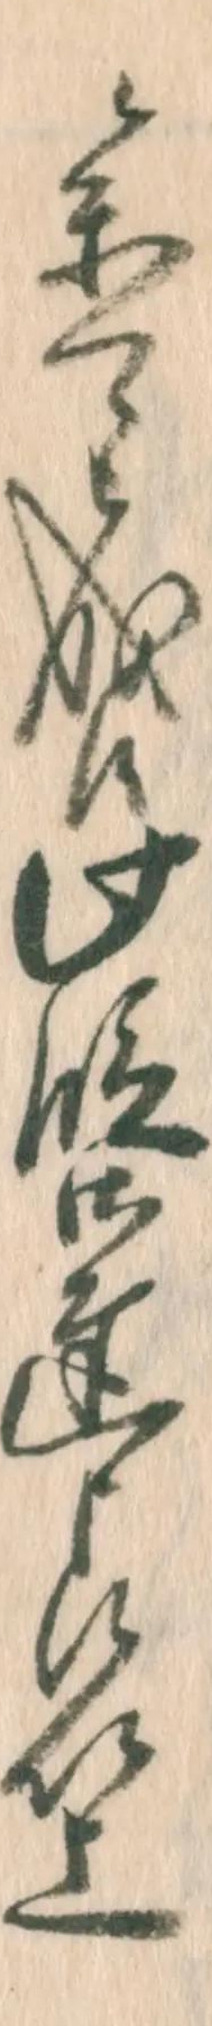参可被成候此段御達申候以上
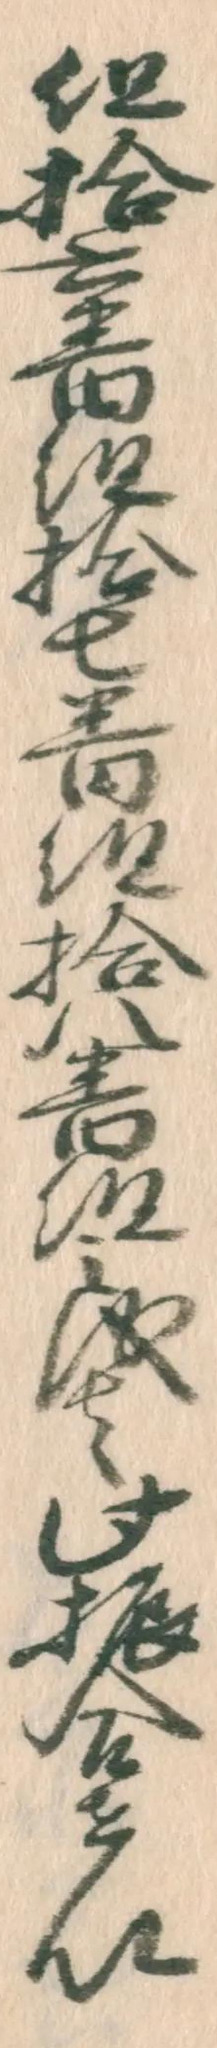但拾六番組拾七番組拾八番組之儀は此振合を以
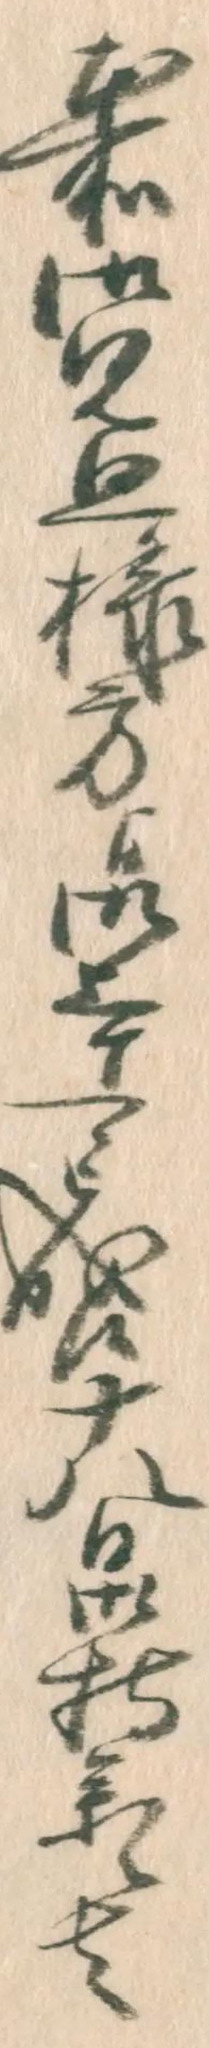本所御見廻り様方江御上ケ可被成候十八日御持参候は
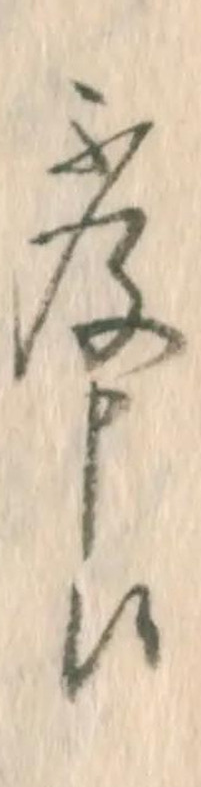不及申候
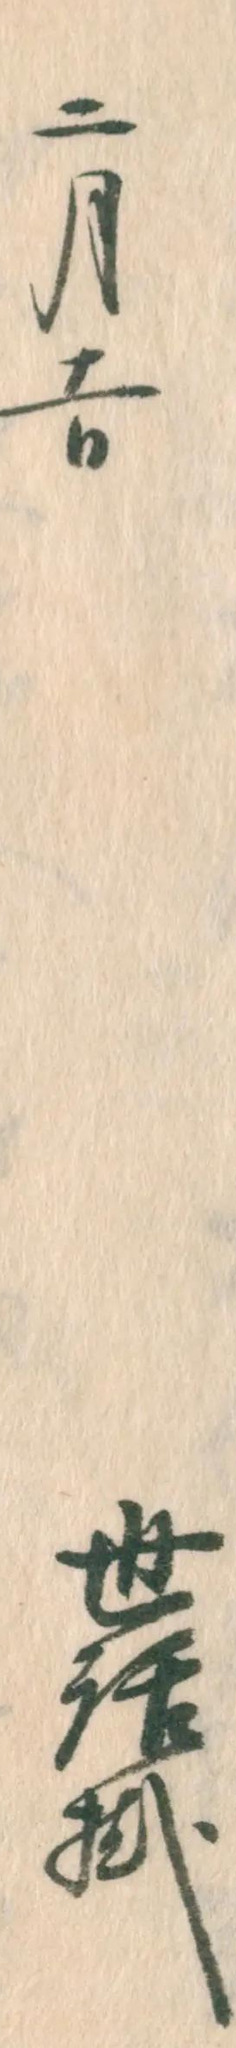二月十一日世話掛

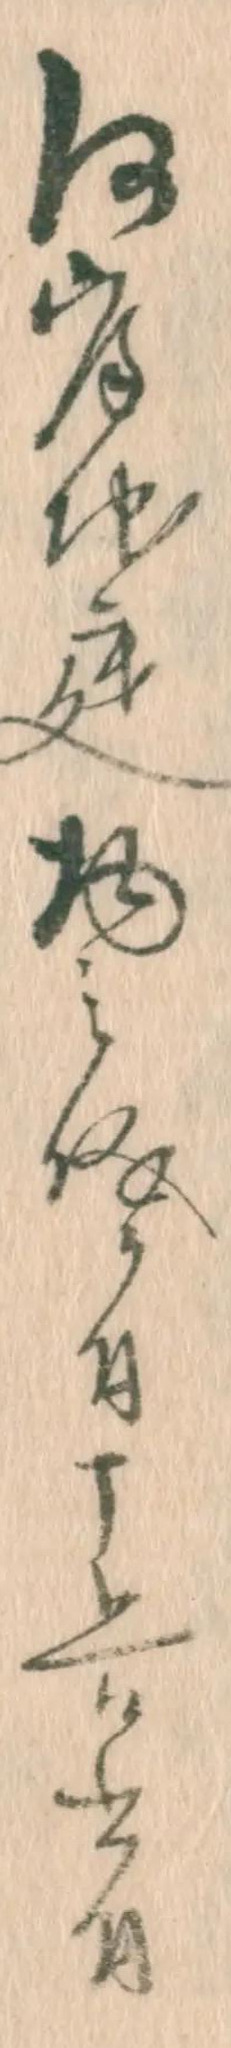河岸地建物之儀ニ付申上候書付
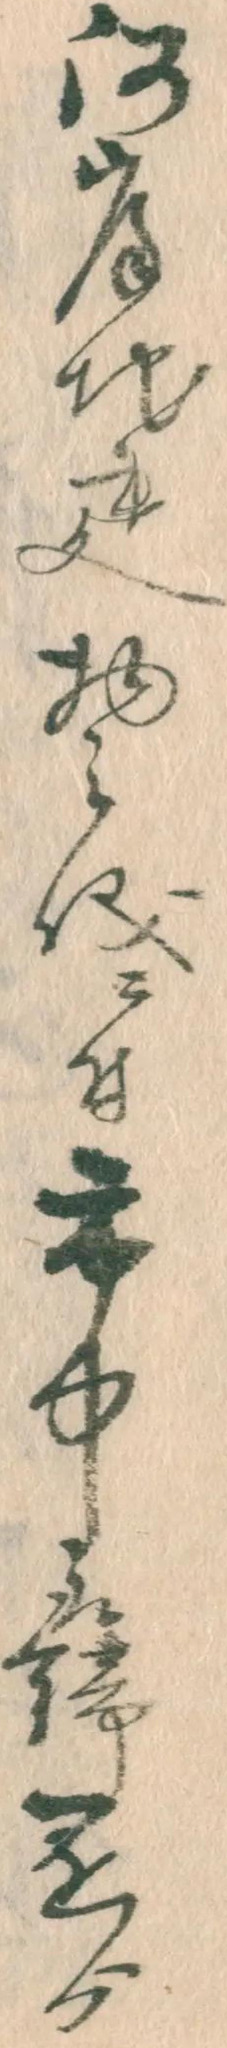河岸地建物之儀ニ付市中取締懸ゟ
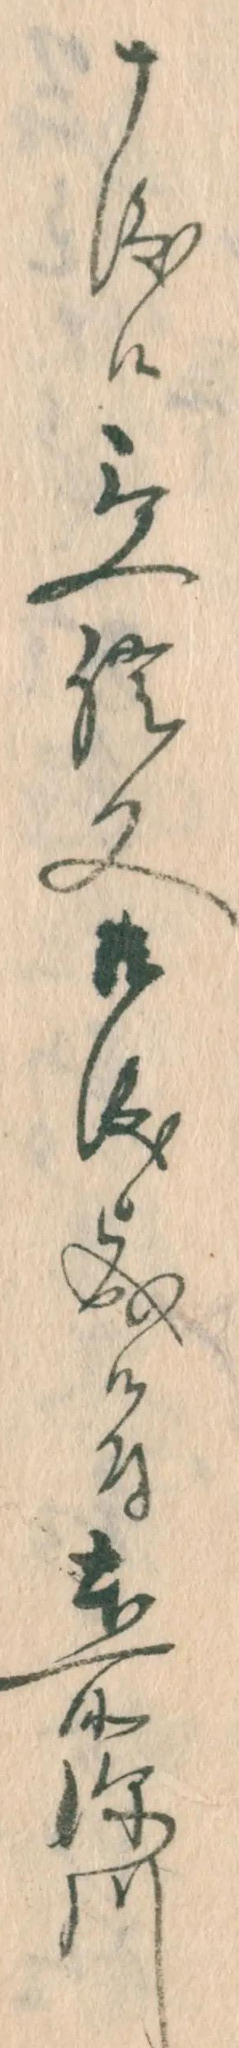申渡候受証文御渡被成候付本所深川

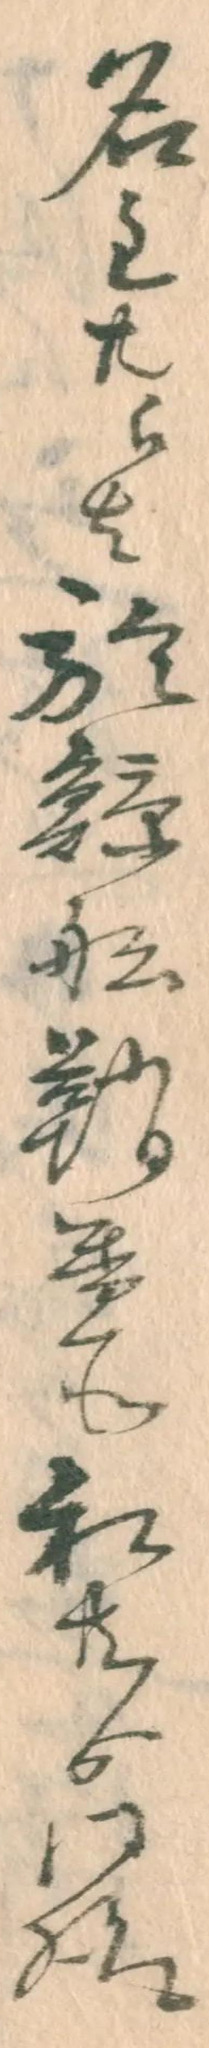名主共江は於鯨船鞘番所私共ゟ同様
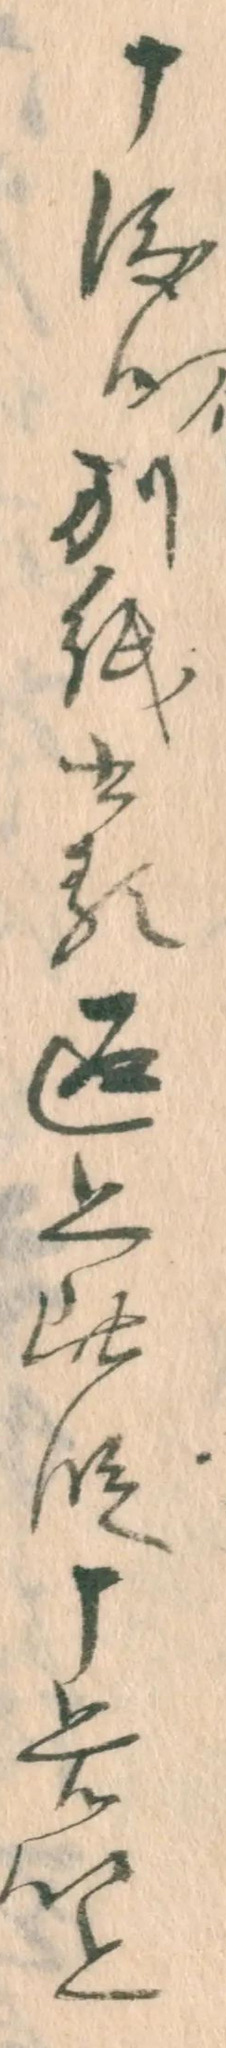申渡候依之別紙書類返上此段申上候以上
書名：地震災書留 2巻. [1] 内表紙に「地震災書留　安政二卯年　但本所深川御用屋敷地代免除調」とあり
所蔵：国立国会図書館 National Diet Library, JAPAN
